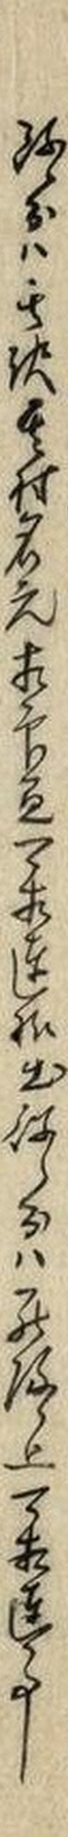致候分は其訳其村名元相印置可相達様出役之分は罷帰候上可相達事
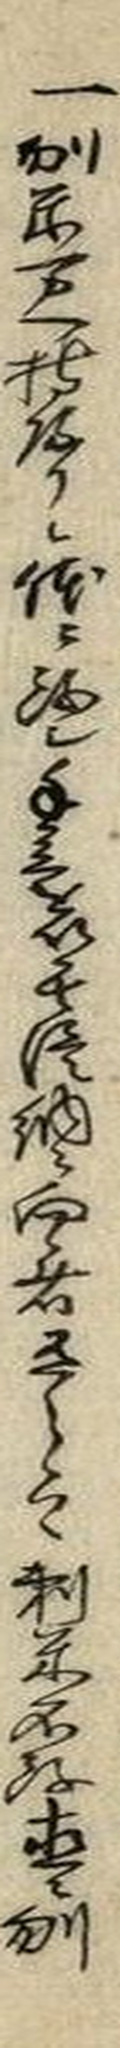一刎米万一持帰り候体に致シ手立を以其儘納に向候者有之候はゝ刺米不致直に刎
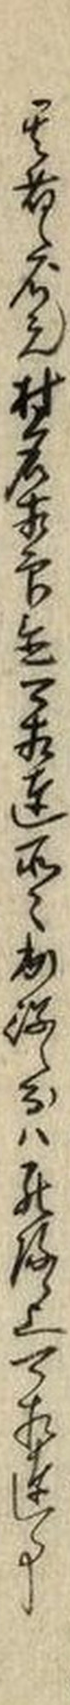其者之名元村名相印置可相達所々出役之分は罷帰候上可相達事
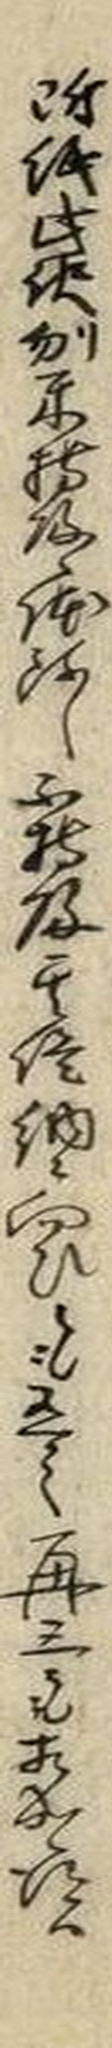附紙此訳刎米持帰候体致し不持帰其儘納に向ひ候も有之再三にも相成候得は
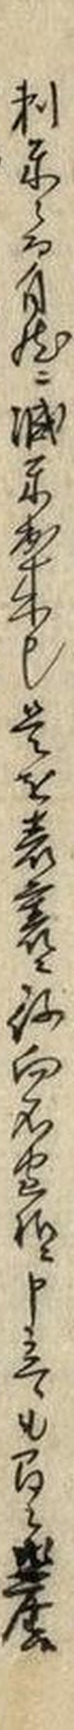刺米にて自然に減米出来申候是を表裏に役向不宜様に申立候も間々御座候
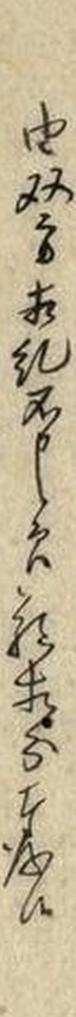由双方相糺不申候ては難相分奉存候
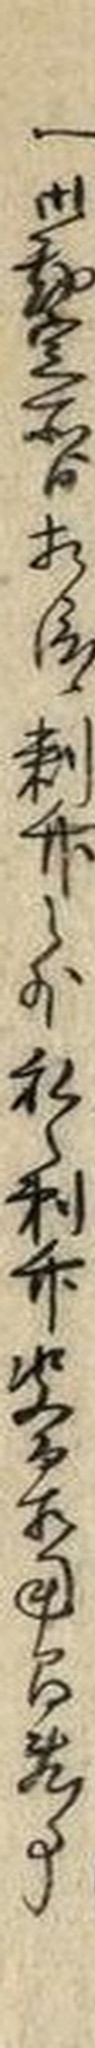一御勘定所ゟ相渡候刺竹之外私之刺竹決て相用間敷事
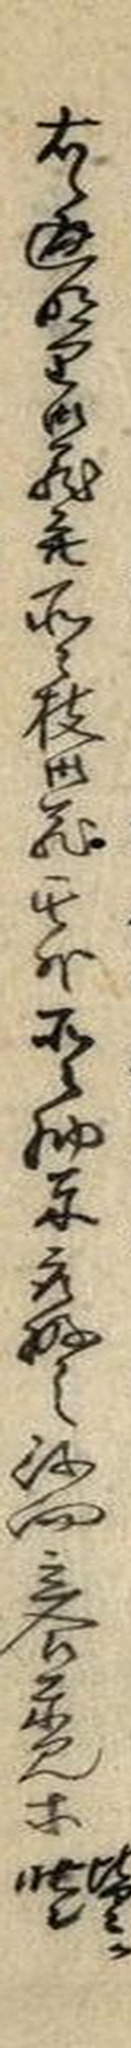右之通明里御蔵并所々枝御蔵其外所々納米取扱之役向立合米見等皆々ク此レ
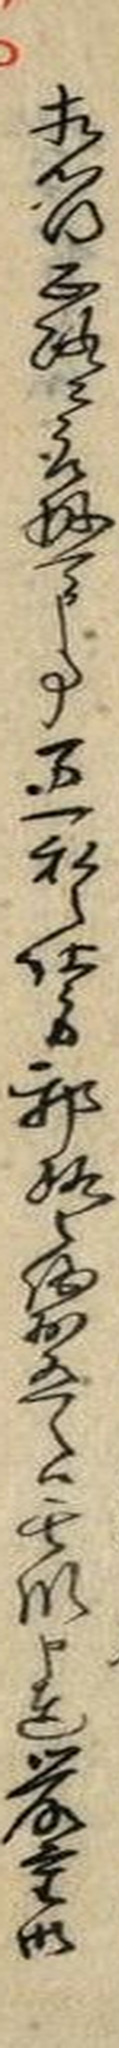相心得正路に取扱可申事万一私之仕方邪路之儀於有之は其段申達厳重御

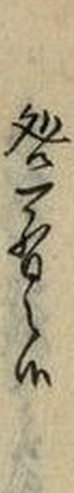咎可有之候
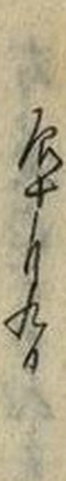辰十月九日

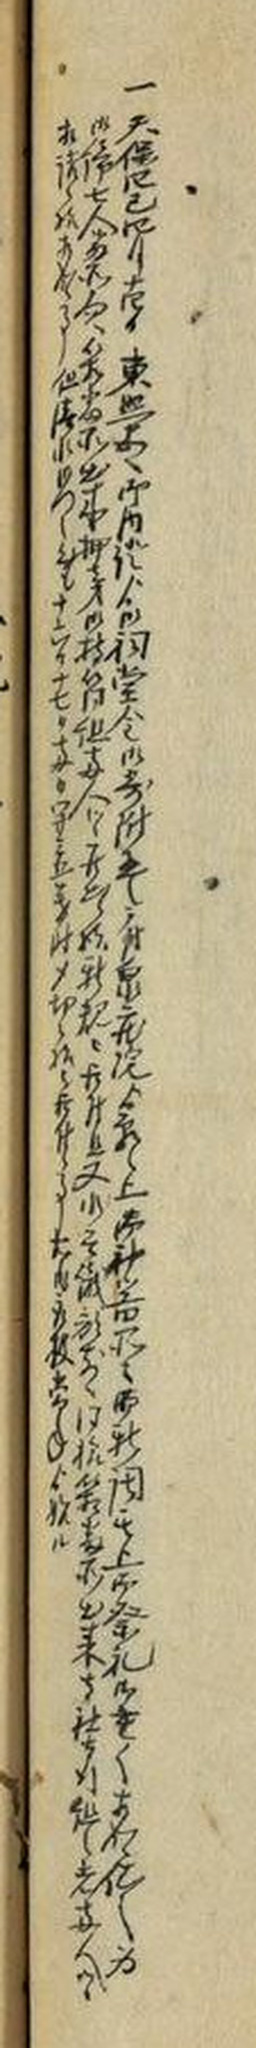一天保四巳四月十四日東照宮へ御内証ゟ御祠堂金御寄附有之に付泉蔵院ゟ願之上御神器品々御新調其上御祭礼御重く相成候依之為
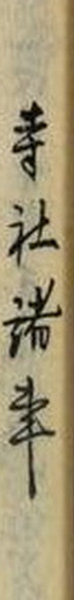寺社諸事
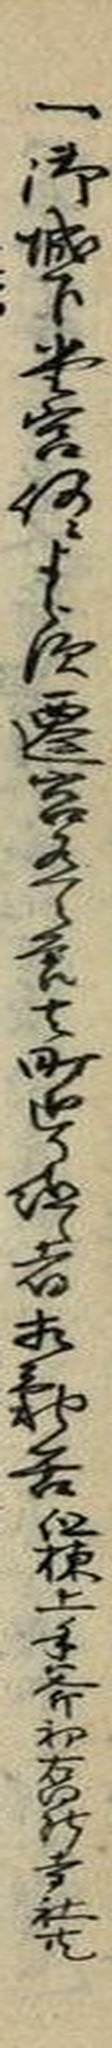一御城下堂宮何によらす遷宮有之節は町廻り組之者相勤候筈但棟上手斧初右同断寺社共
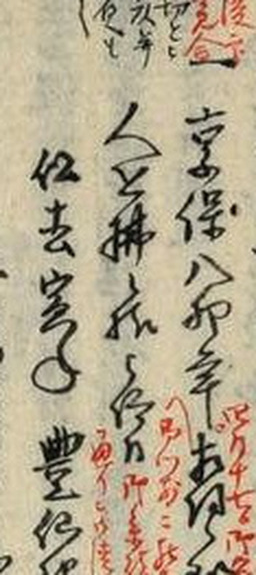人を払候様被仰付
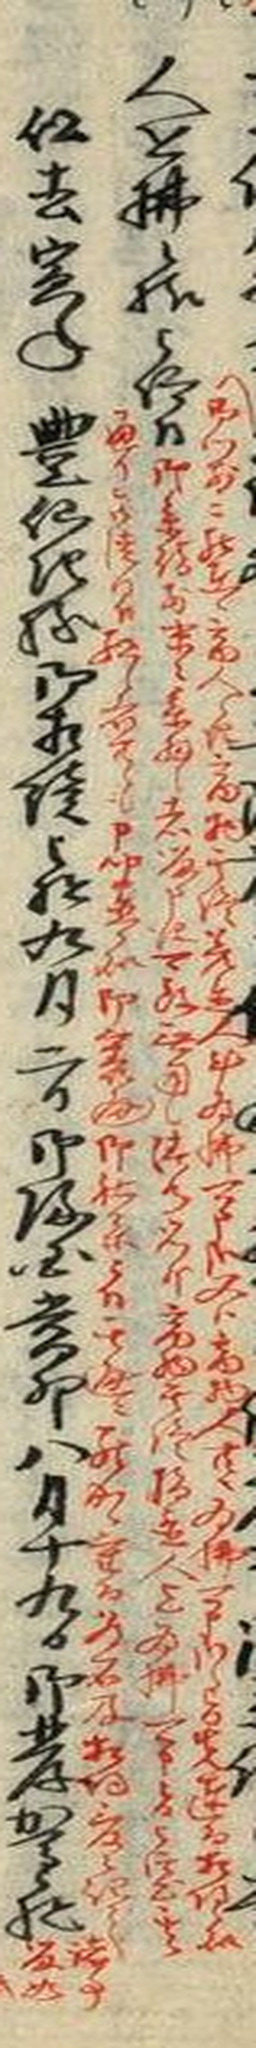但去寅年豊仙院様御相続被遊九月二日御帰国当卯八月十九日御発駕被遊
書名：御城下諸事之部
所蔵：福井県文書館 Fukui Prefectural Archives
